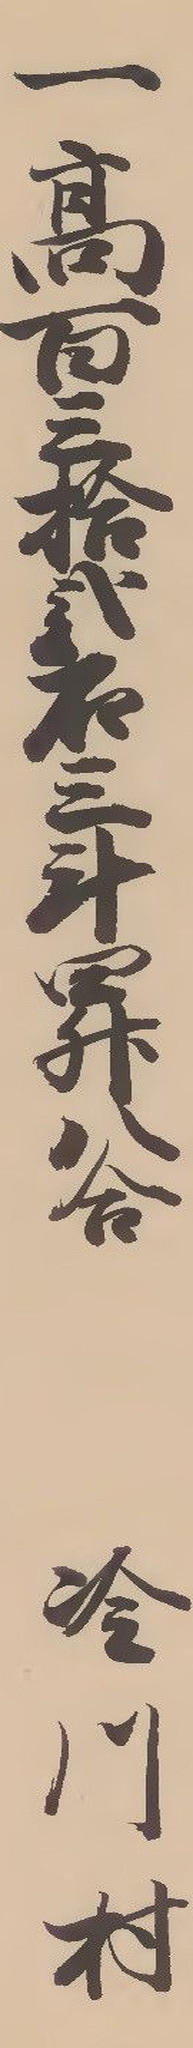一高百三拾弐石三斗四升八合冷川村
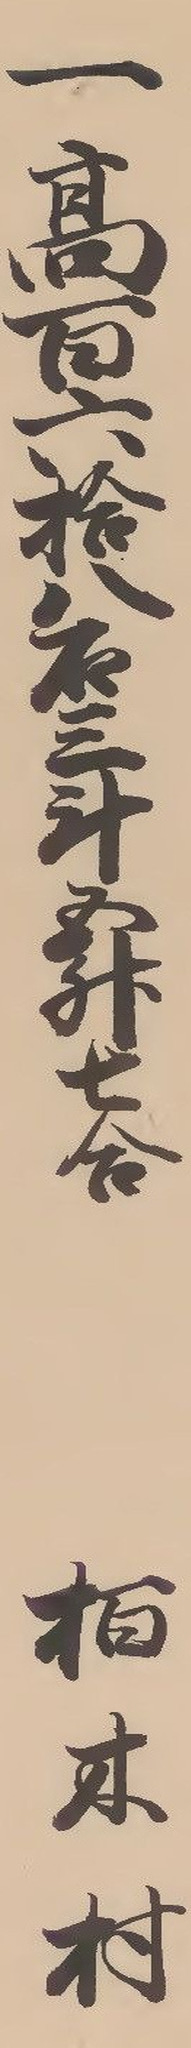一高百六拾八石三斗五升七合栢木村

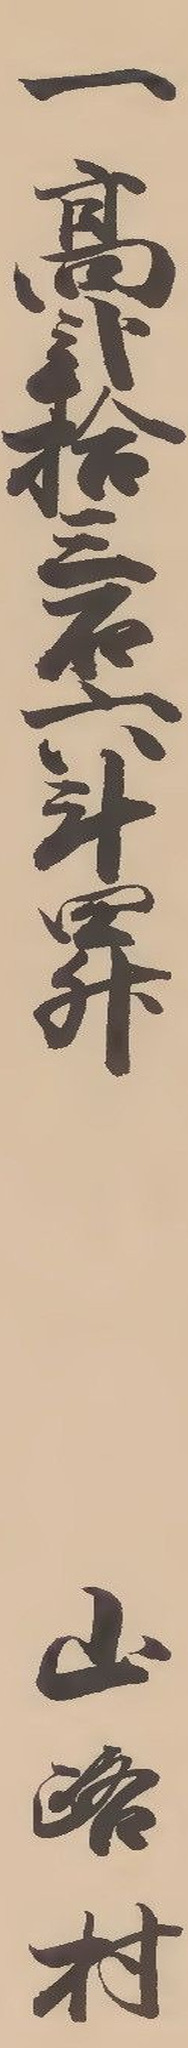一高弐拾三石六斗四升山路村
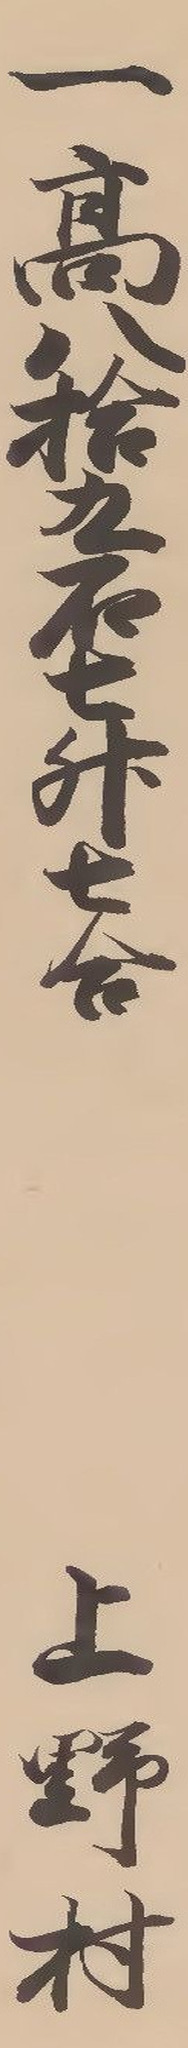一高八拾九石七升七合上野村
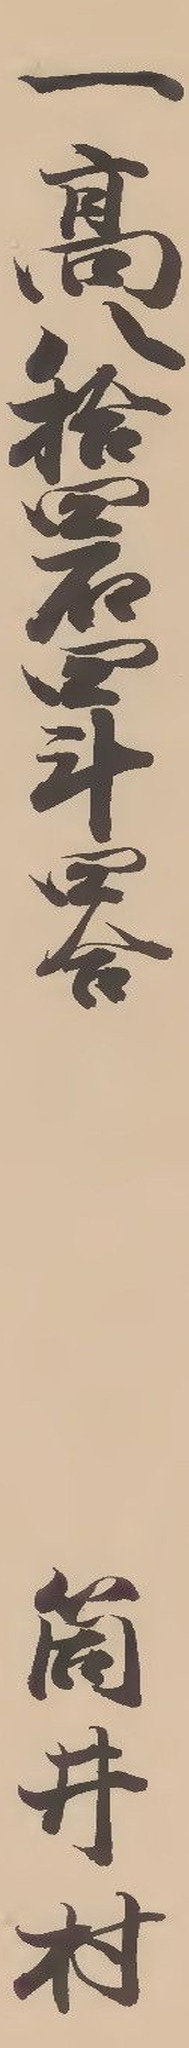一高八拾四石四斗四合筒井村
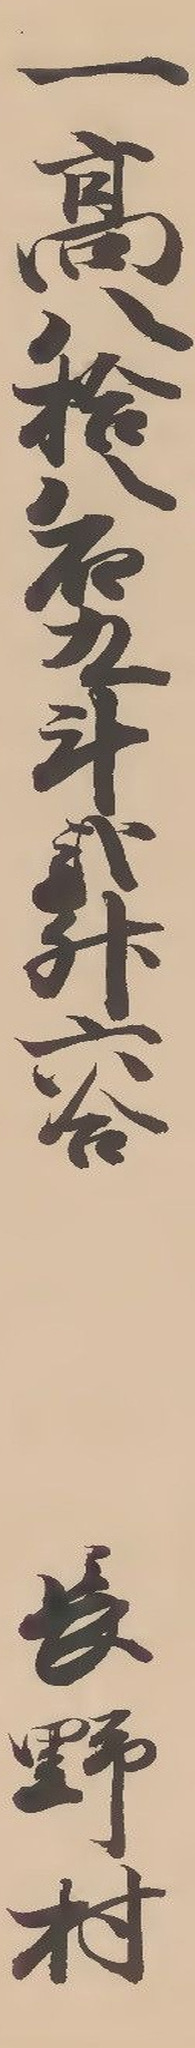一高八拾八石九斗弐升六合長野村
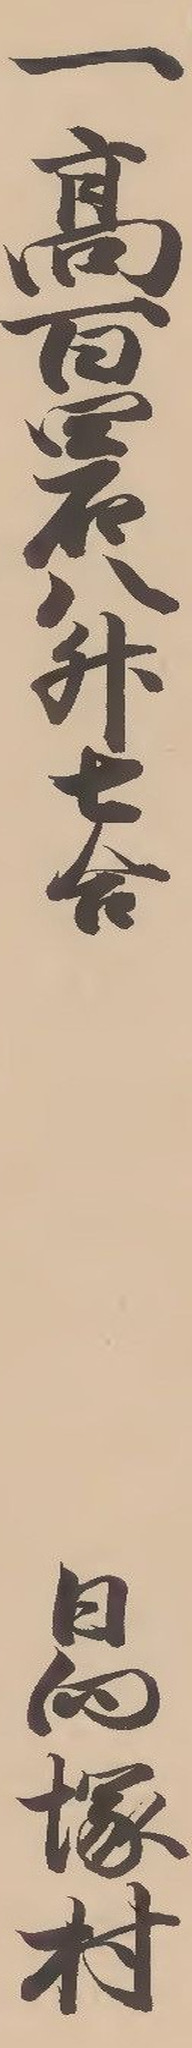一高百四石八升七合日向塚村
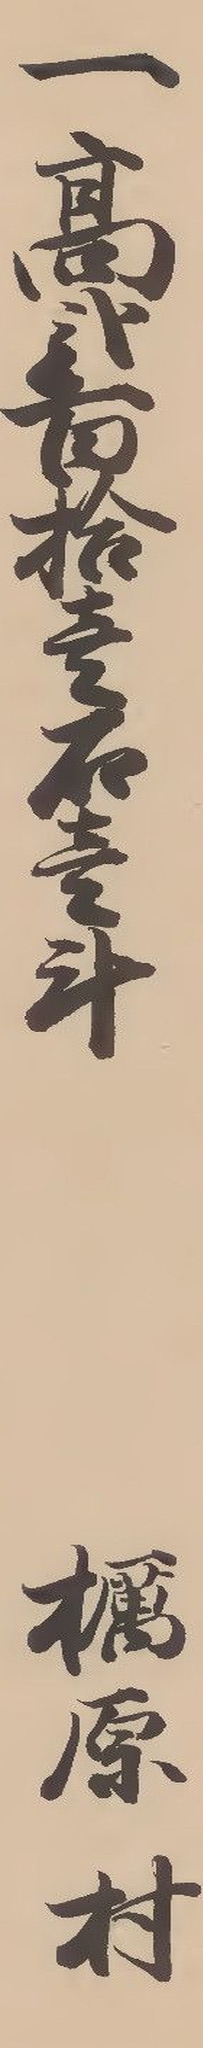一高弐百拾壱石壱斗栃原村
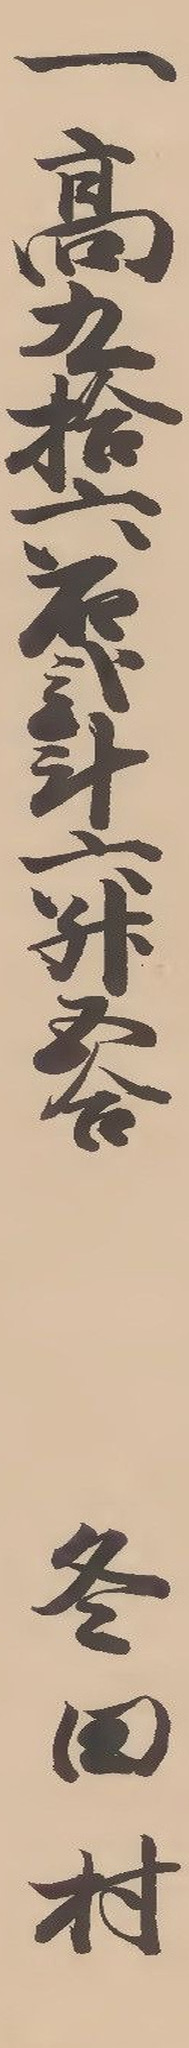一高九拾六石弐斗六升五合冬田村
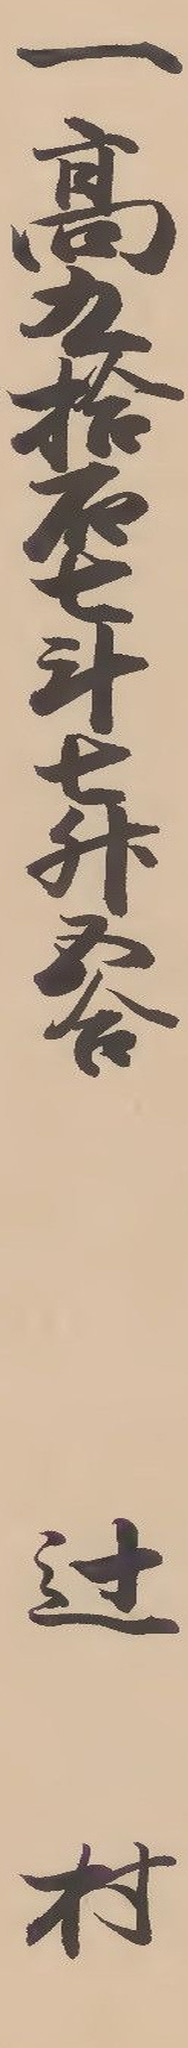一高九拾石七斗七升五合辻村

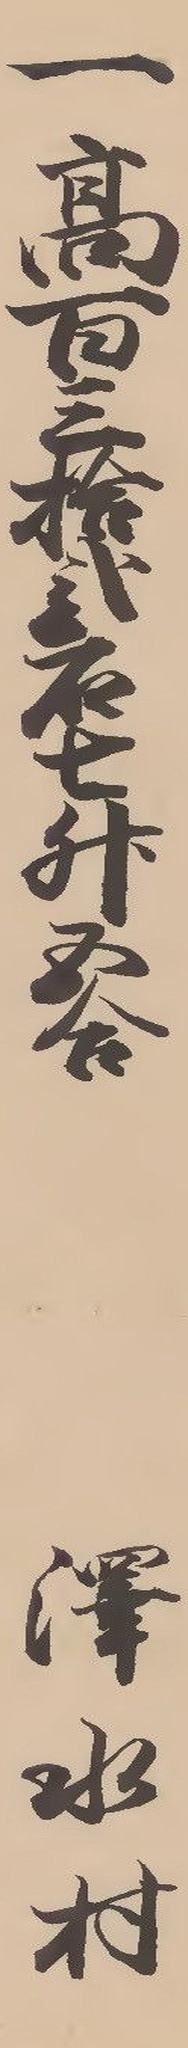一高百三拾弐石七升五合沢水村
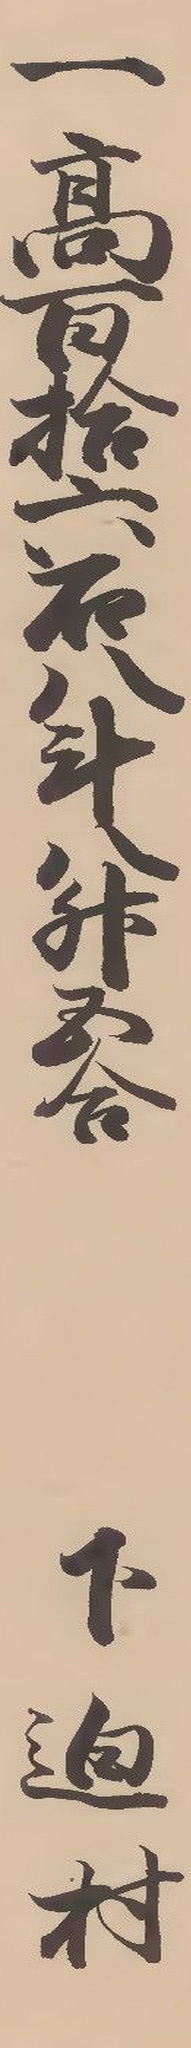一高百拾六石八斗八升五合下迫村
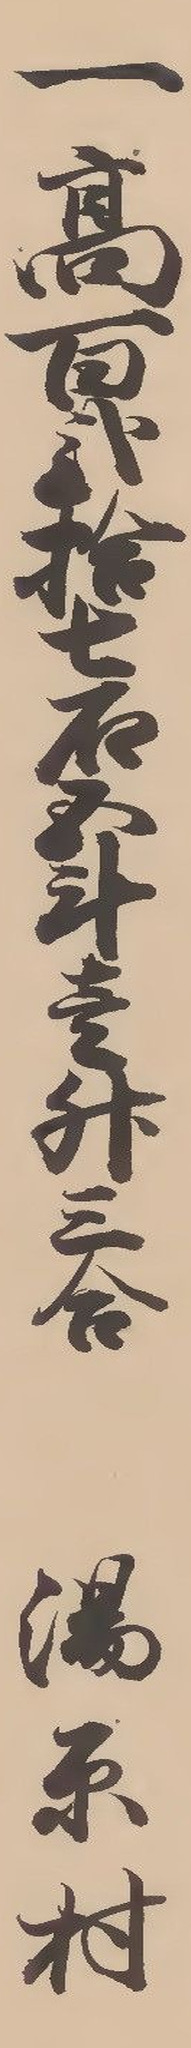一高百弐拾七石五斗壱升三合湯原村
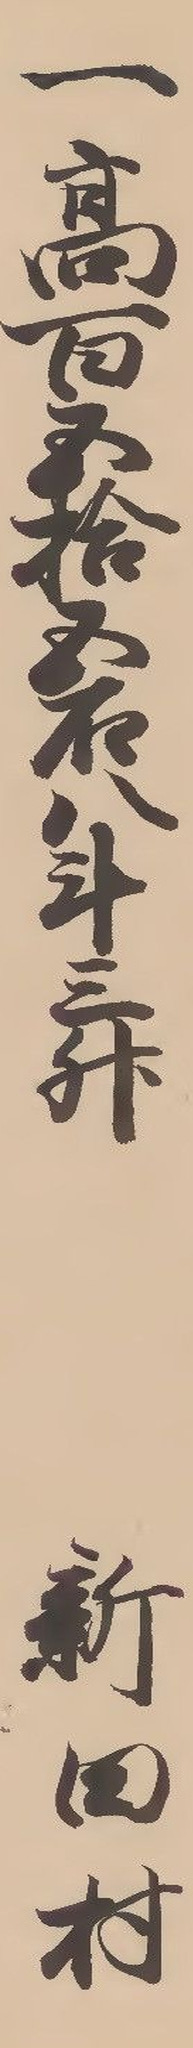一高百五拾五石八斗三升新田村
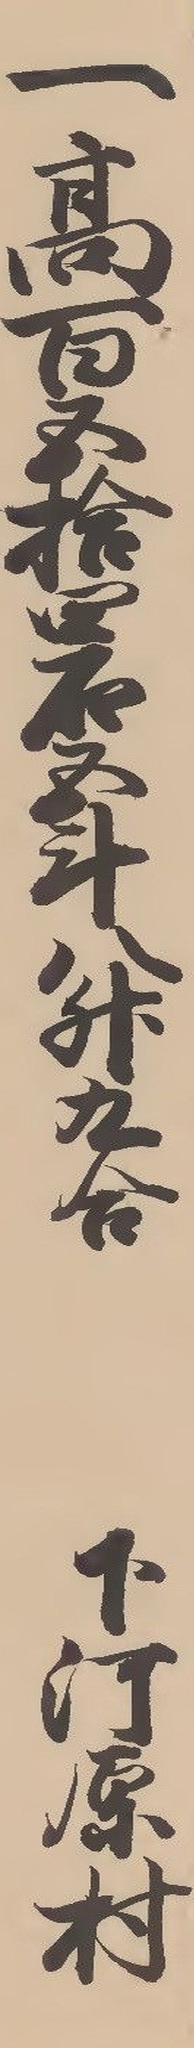一高百五拾四石五斗八升九合下河原村
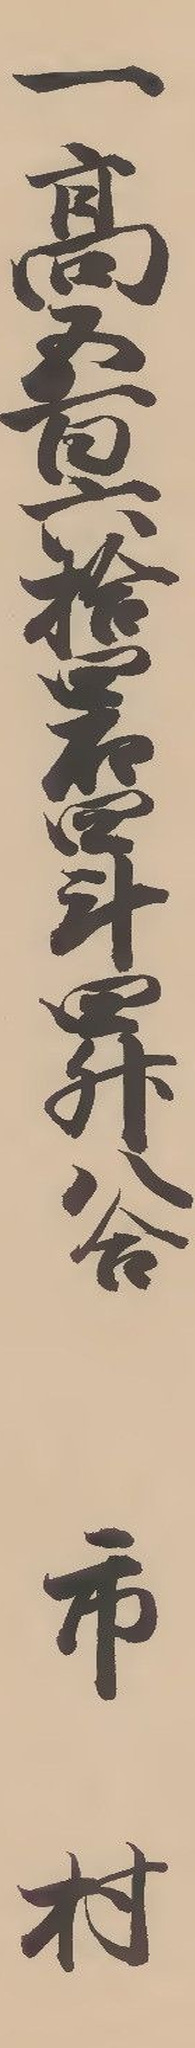一高五百六拾四石四斗四升八合市村
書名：豊後国郷帳
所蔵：国立公文書館 National Archives of Japan
